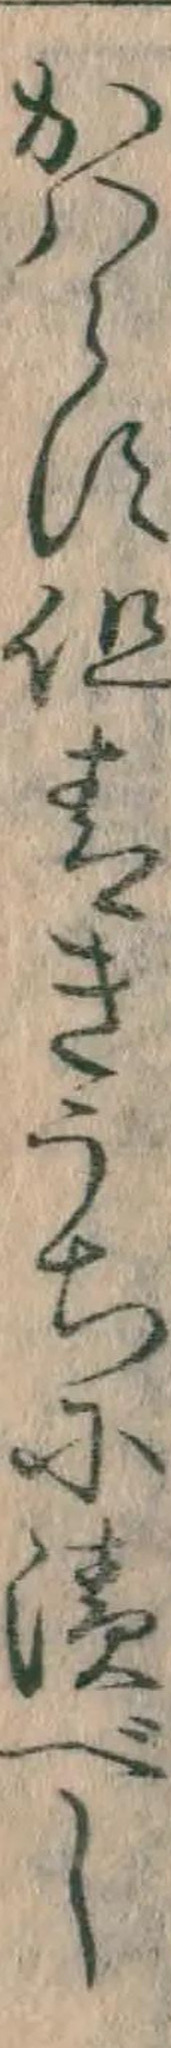かはらず但青きうちに漬べし
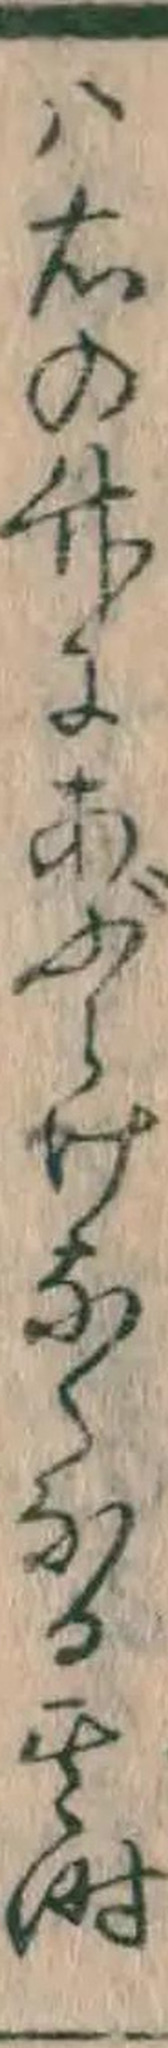は右の竹にあぶらけなくなる其時
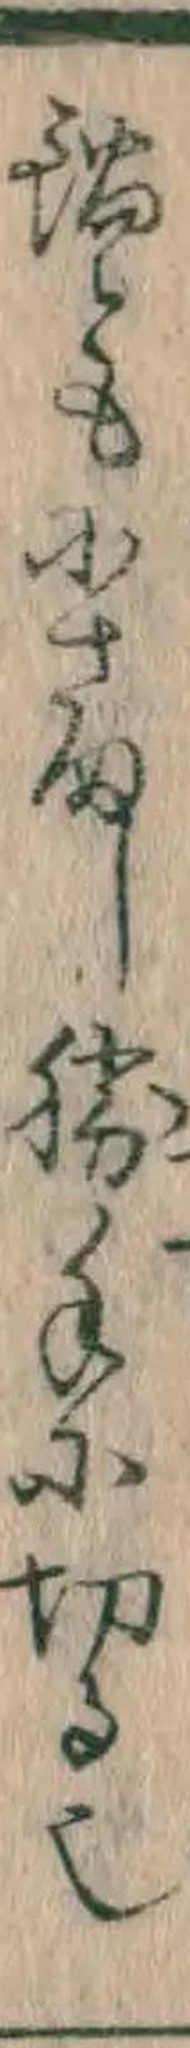鍋ともにさまし勝手に切る也
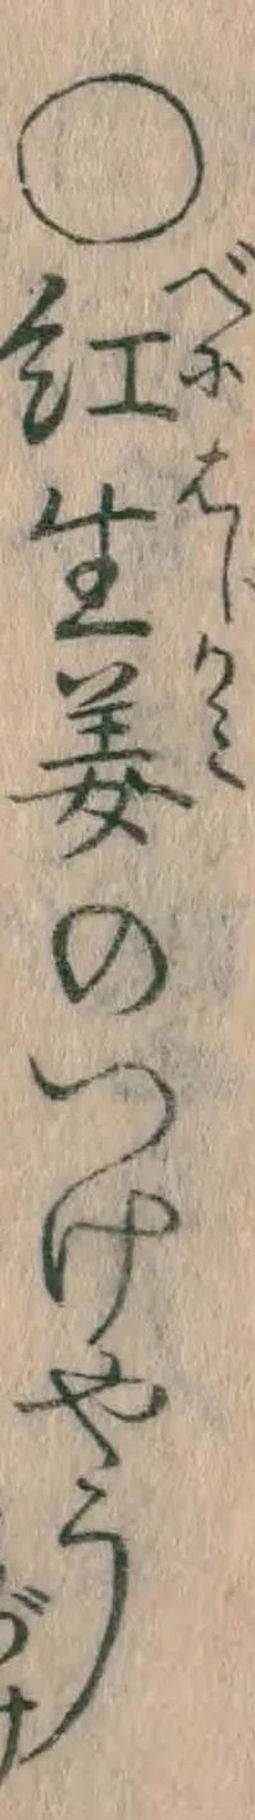○紅生姜のつけやう
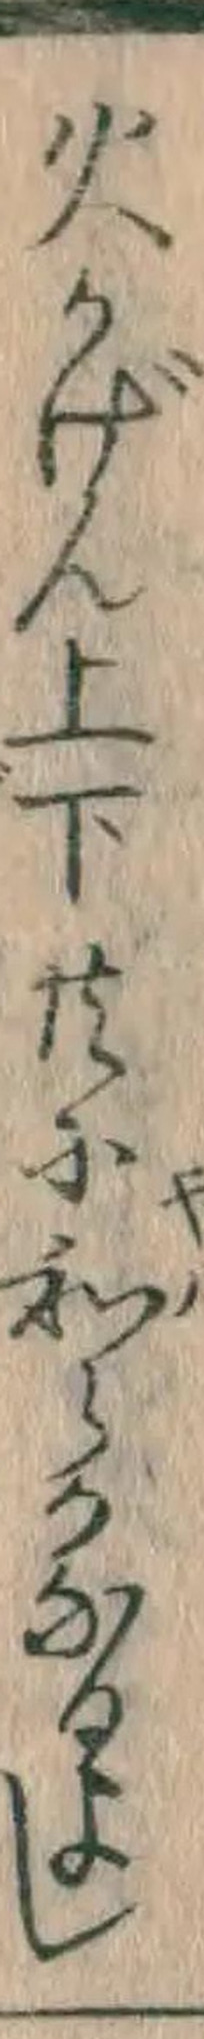火かげん上下共に和らかなるよし
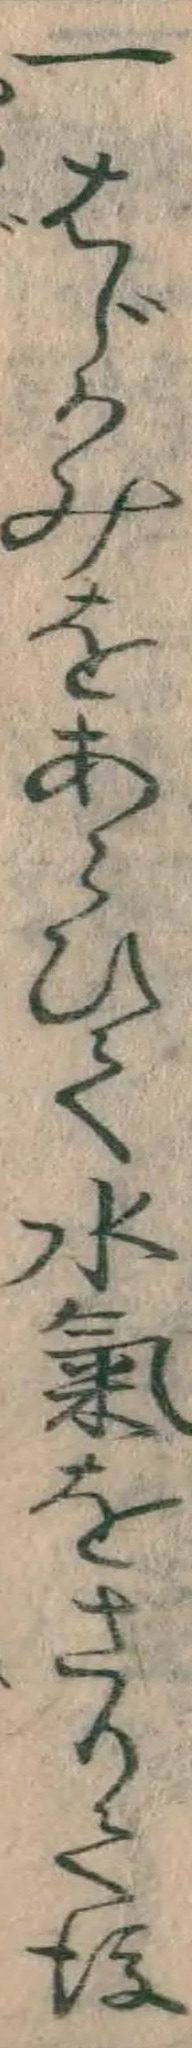一はじかみをあらひて水気をさりて後
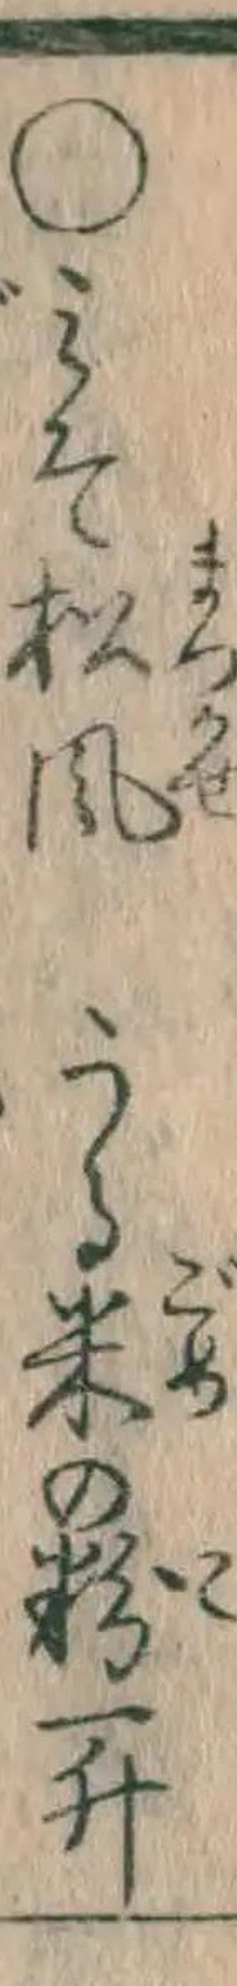○みそ松風うる米の粉一升
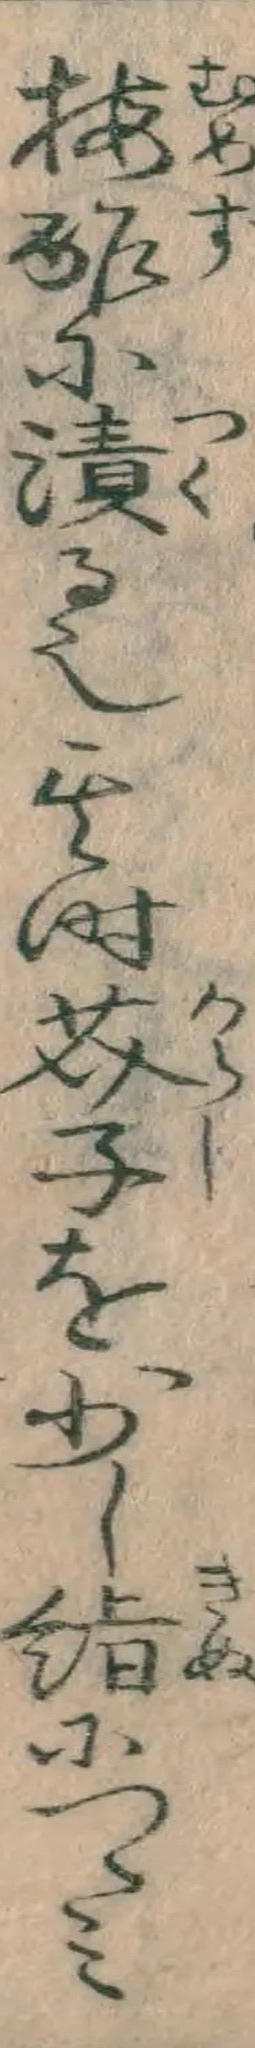梅酢に漬る也其時芥子を少し絹につゝみ
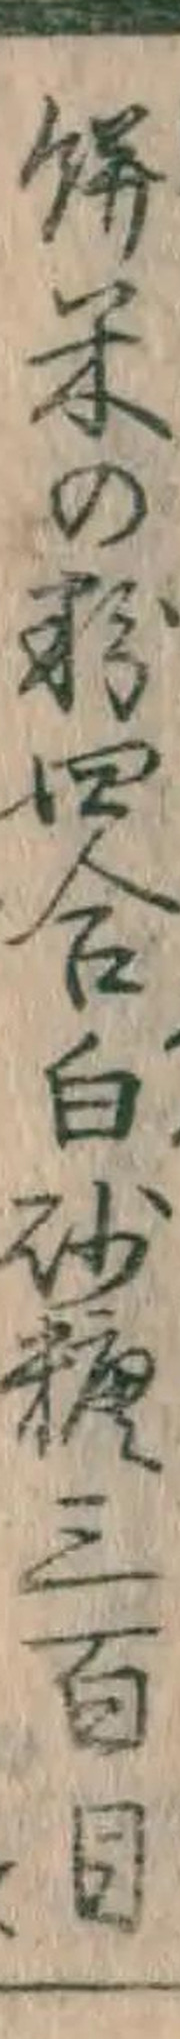餅米の粉四合白砂糖三百目
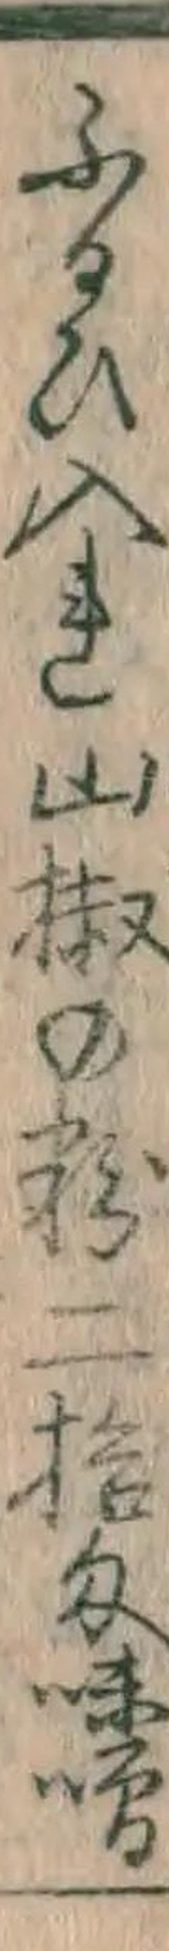ふるひ入れ山椒の粉二拾匁味噌
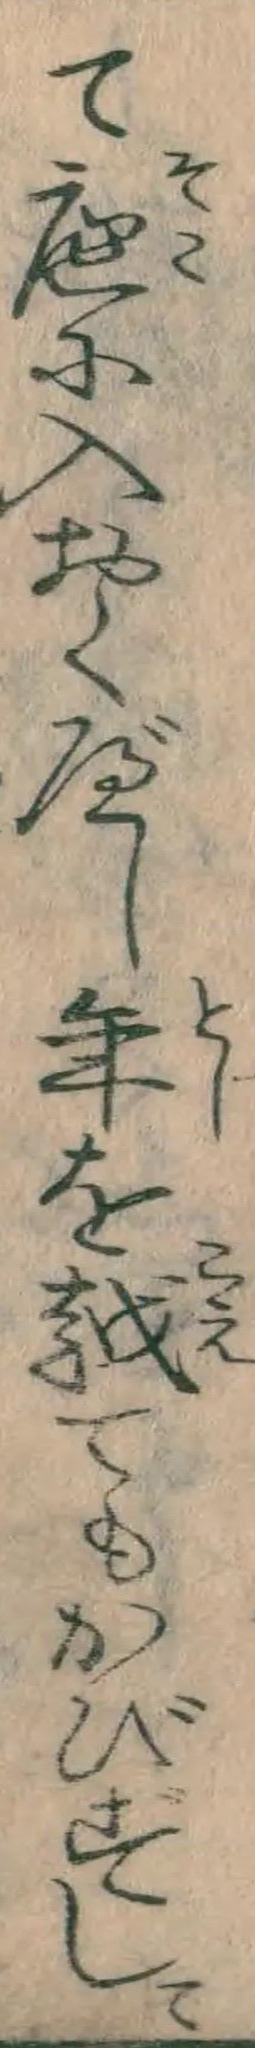て底に入おくべし年を越てもかびずして
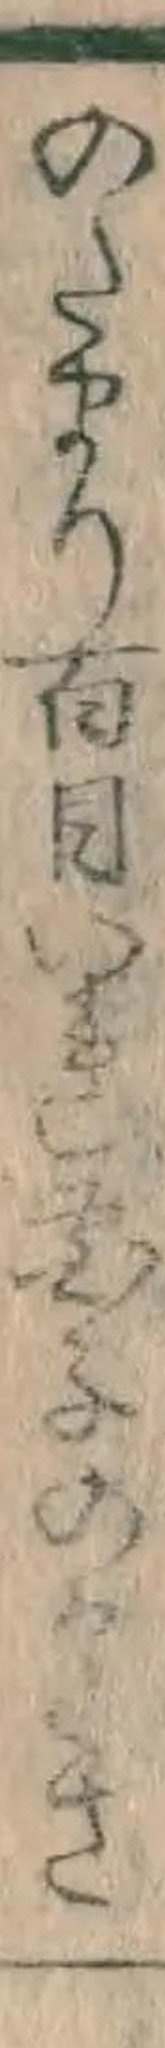のたまり百目いれ団子のかたさ
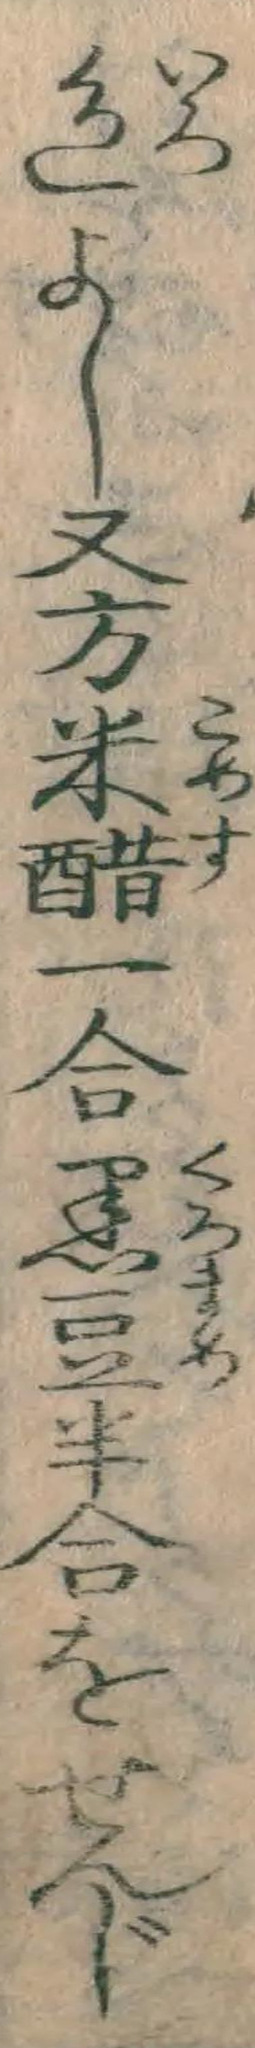色よし又方米醋一合黒豆半合をせんじ

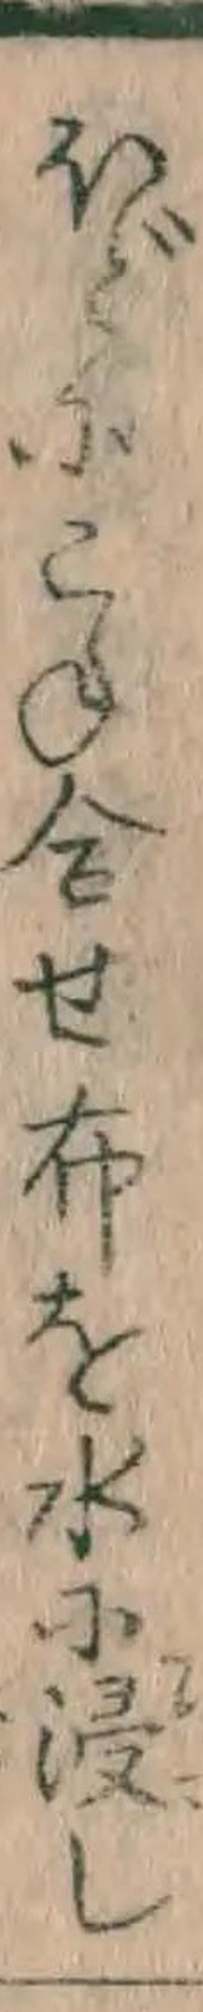ほどにこね合せ布を水に浸し
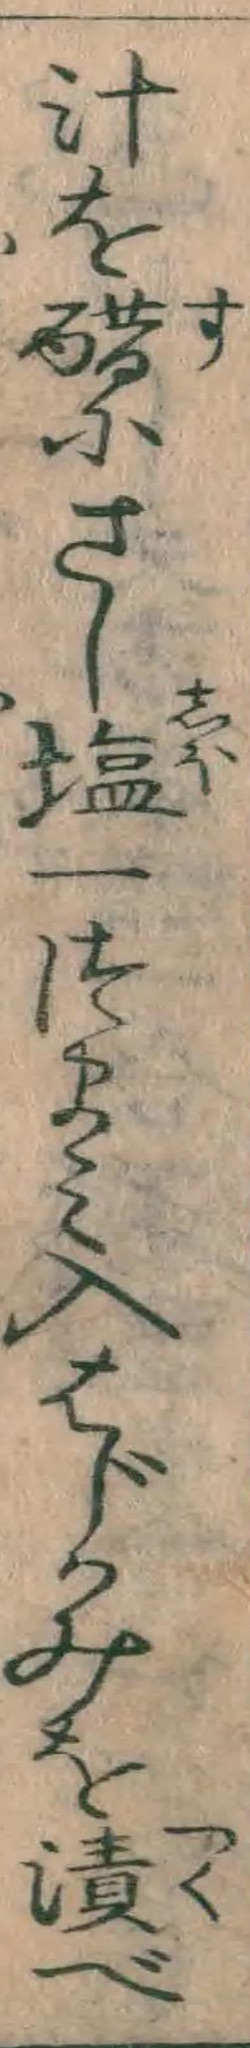汁を醋にさし塩一つまみ入はじかみを漬べ
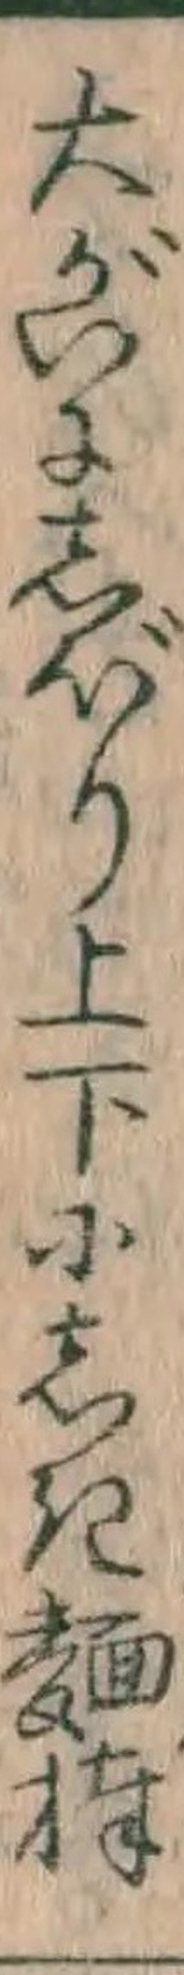大がいにしぼり上下にしき麺棒
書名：広益秘事大全 3巻. [5]
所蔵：国立国会図書館 National Diet Library, JAPAN
